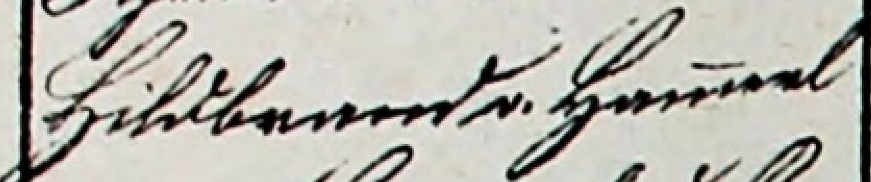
Hildbrand v. Hammerl
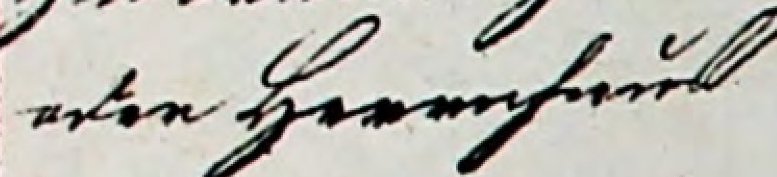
oder Herrnhaus
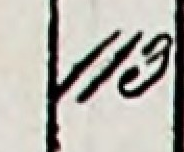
131
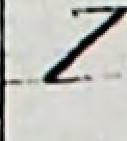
I
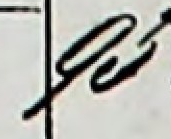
95
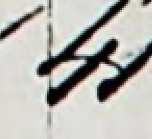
41
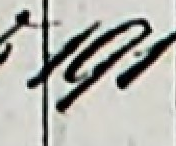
191
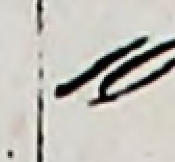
10
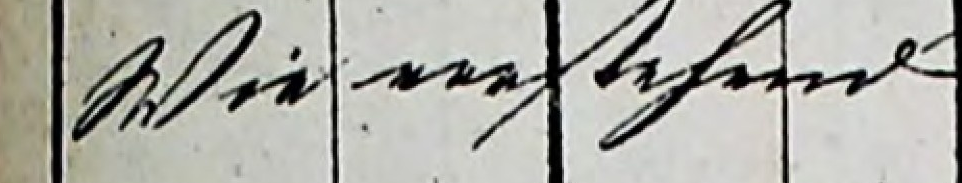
Wie verstehend
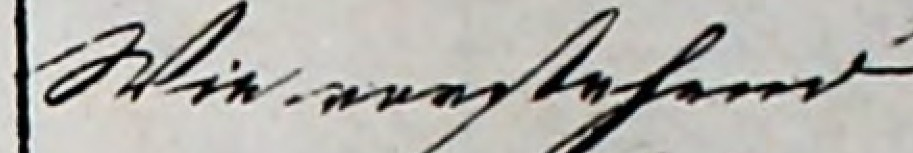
Wie verstehend
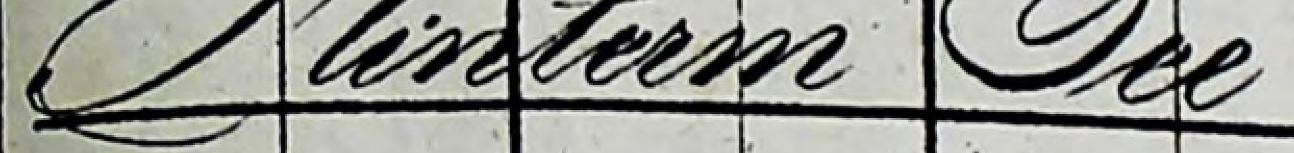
Hinterm See
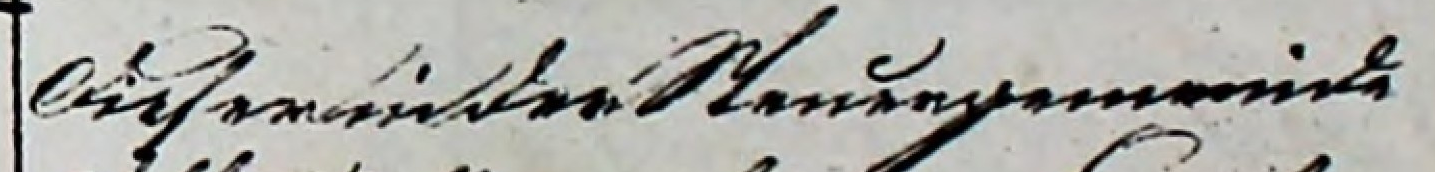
Firser in der Steuergemeinde
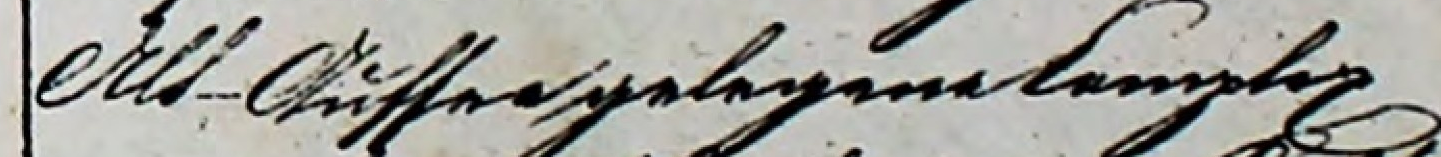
Alt-Ausergelegene Complex
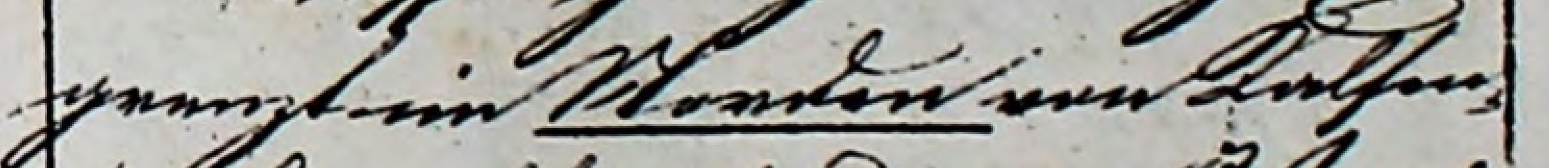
grenzt im Norden von Kalsen„
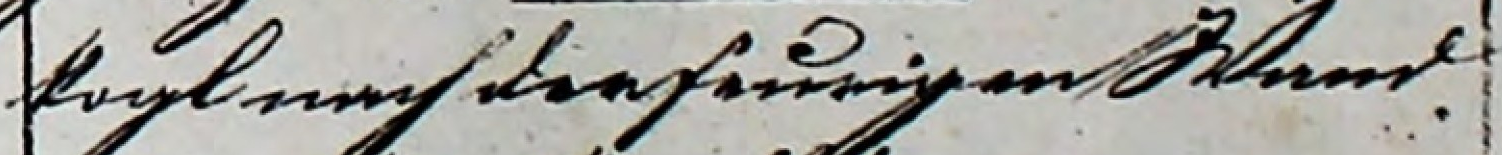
kogl nach der feurigen Wand
